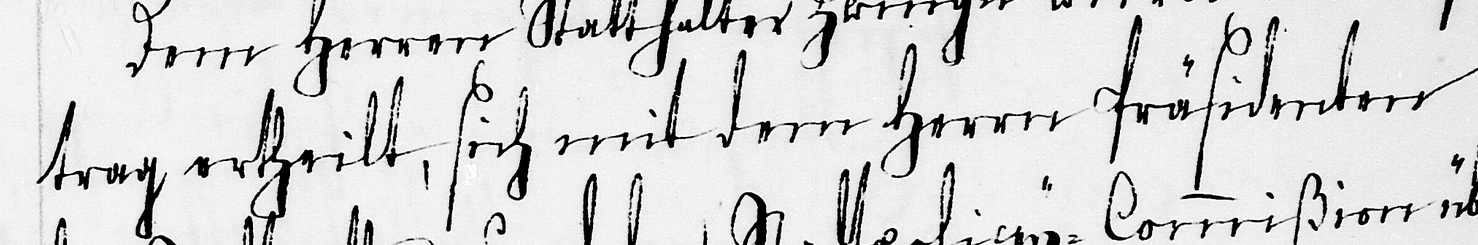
trag ertheilt, sich mit dem Herrn Präsidenten
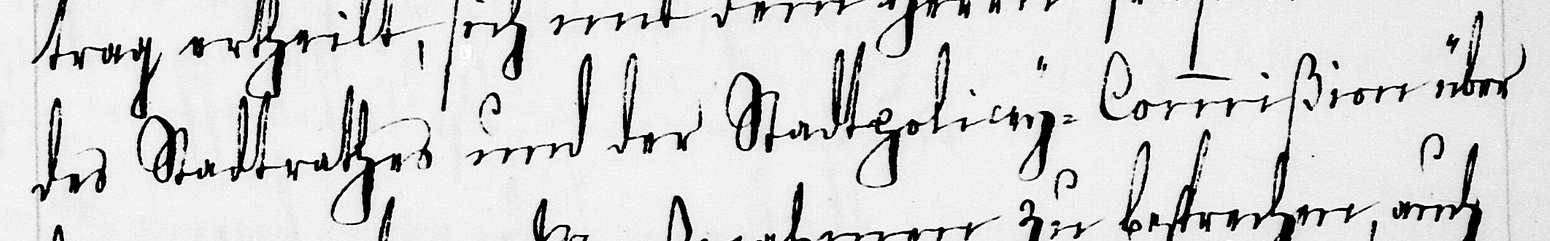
des Stadtrathes und der Stadtpolicey-Commißion über
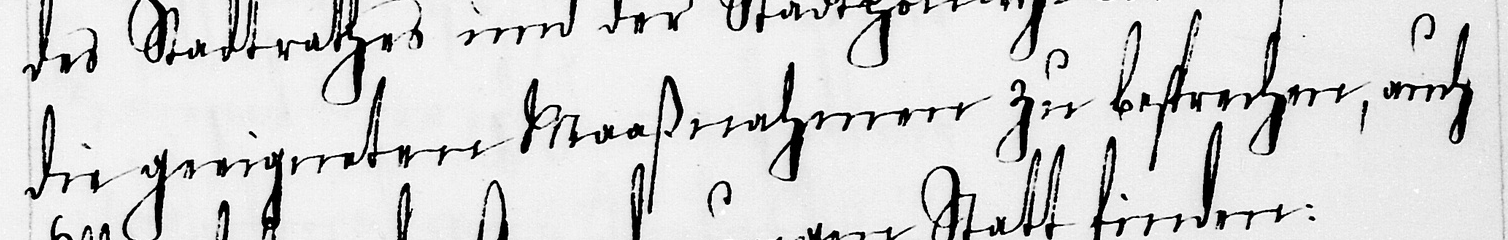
die geeigneten Maaßnahmen zu besprechen, auch
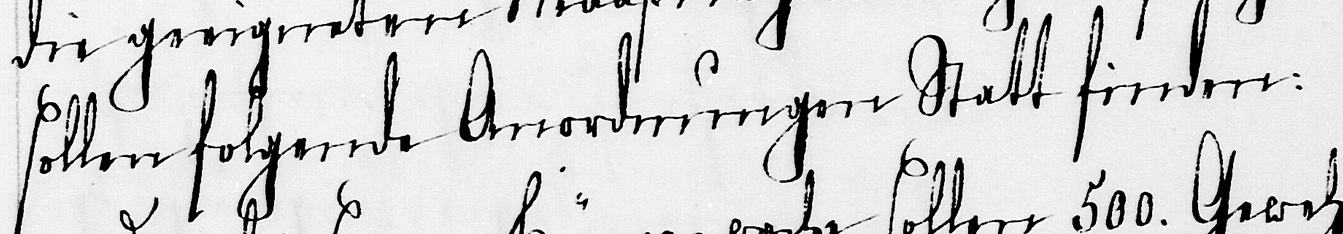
sollen folgende Anordnungen Statt finden:
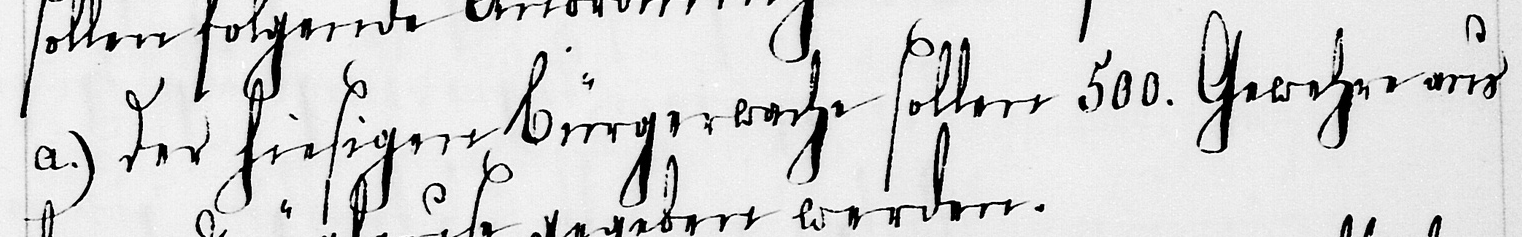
a.) Der hiesigen Bürgerwache sollen 500. Gewehre aus
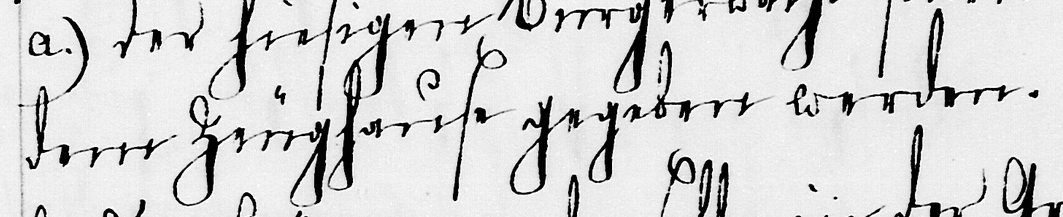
dem Zeughause gegeben werden.
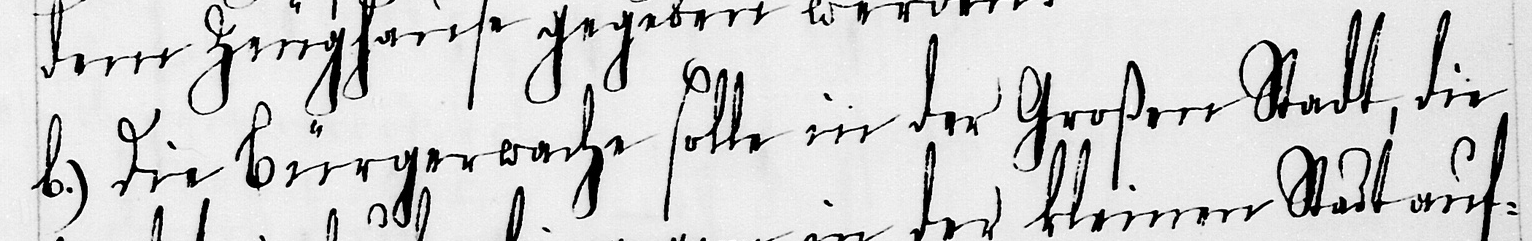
b.) Die Bürgerwache solle in der Großen Stadt, die
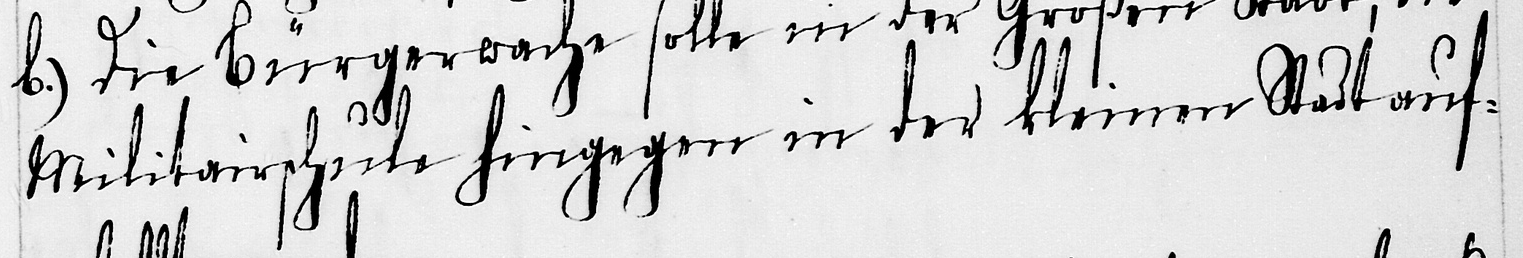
Militairschule hingegen in der kleinen Stadt auf¬
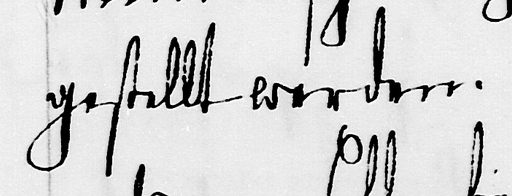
gestellt werden.
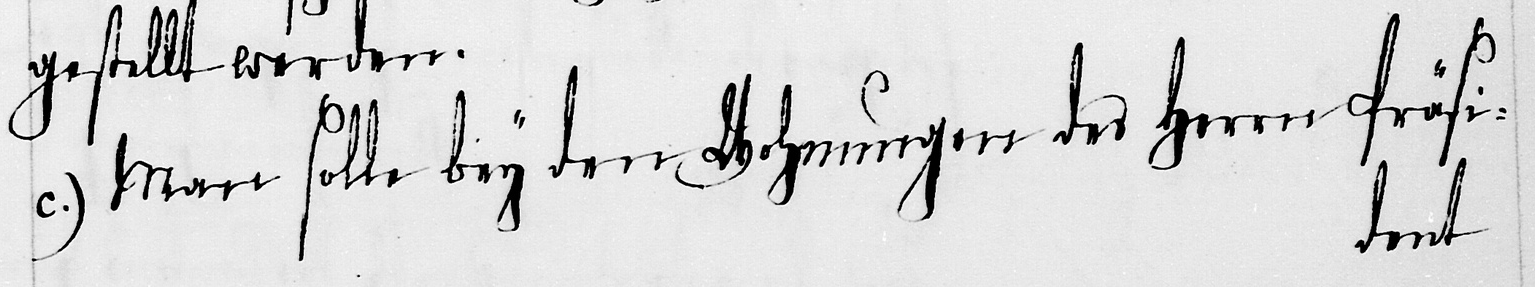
c.) Man solle bey den Wohnungen des Herrn Präsi-
